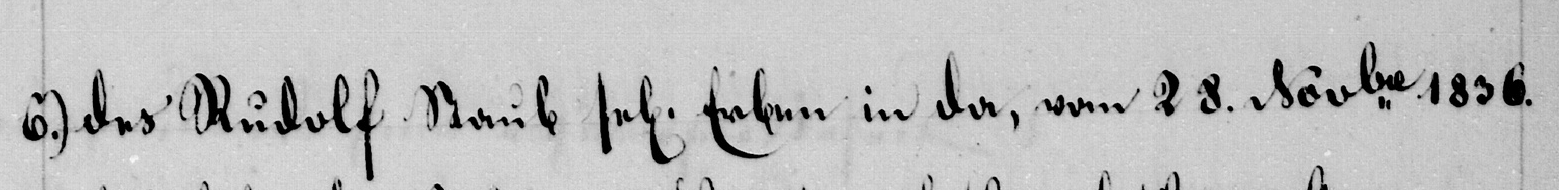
6.) des Rudolf Staub sel[igen] Erben in da, vom 28. Novbre 1836.
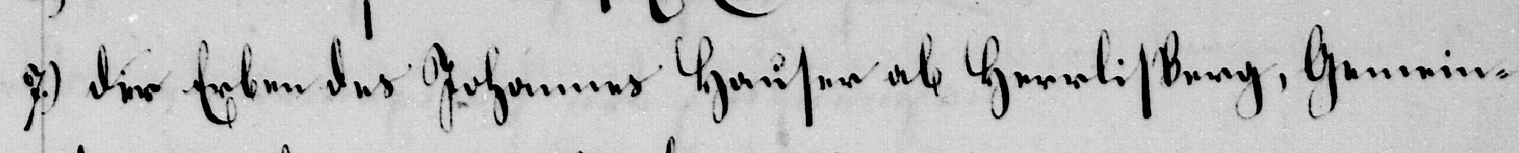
7.) des Erben des Johannes Hauser ab Herrlisperg, Gemein¬
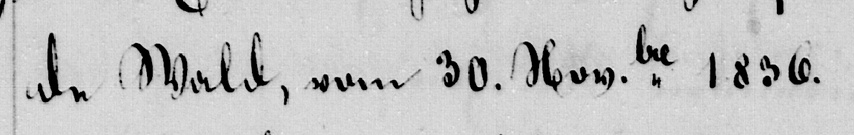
de Wald, vom 30. Novbre 1836.
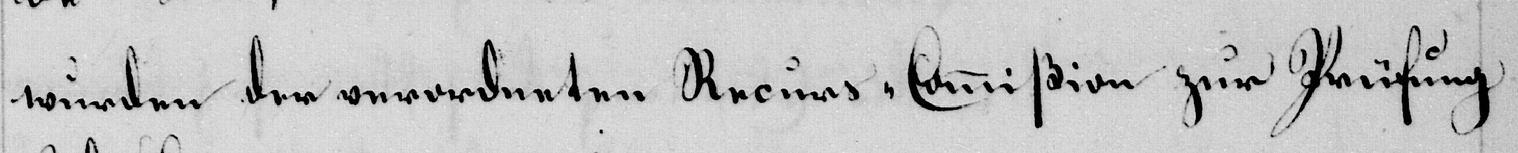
wurden der verordneten Recurs-Commißion zur Prüfung
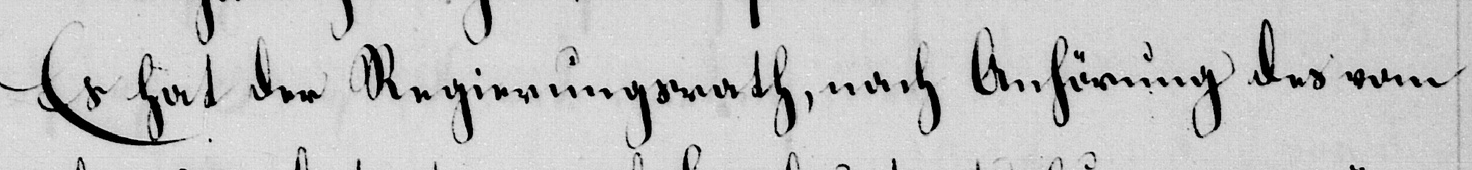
Es hat der Regierungsrath, nach Anhörung des vom
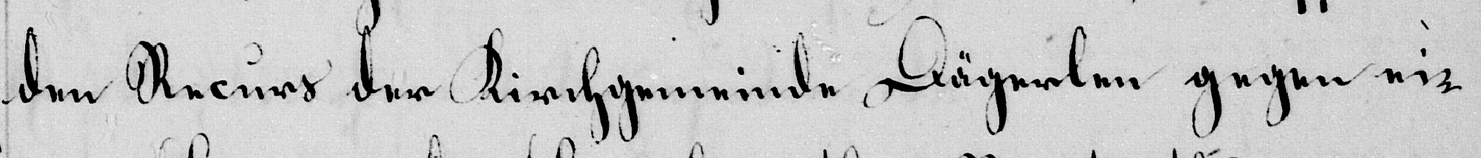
den Recurs der Kirchgemeinde Dägerlen gegen ei¬
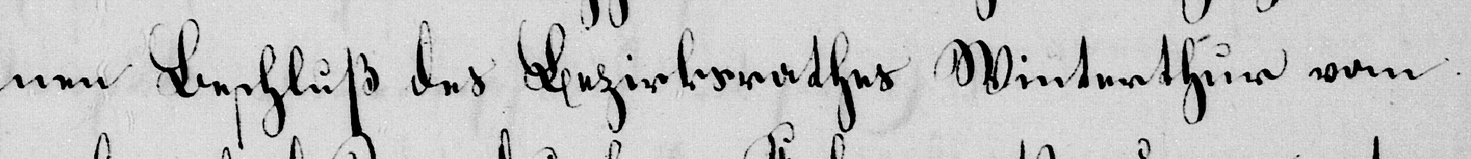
nen Beschluß des Bezirksrathes Winterthur vom
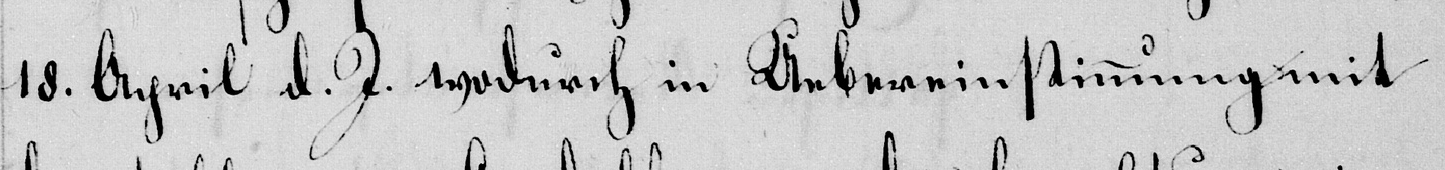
18. April d. J. wodurch in Uebereinstimmung mit
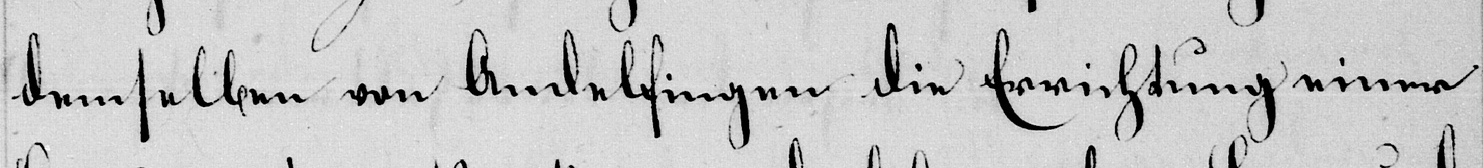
demselben von Andelfingen die Errichtung einer
